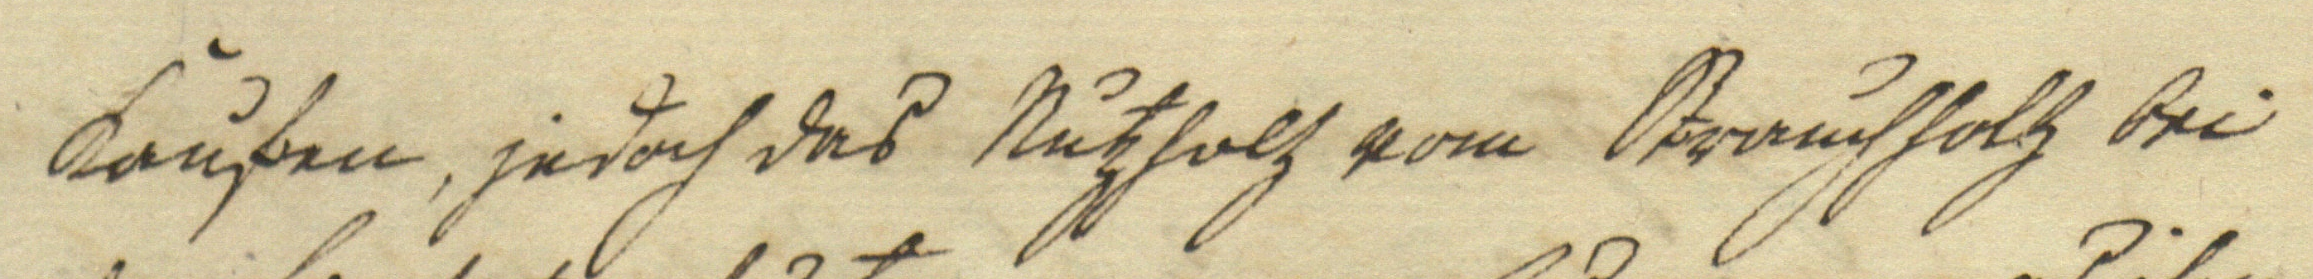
kaufen, jedoch das Nutzholz von Strauchholz bei
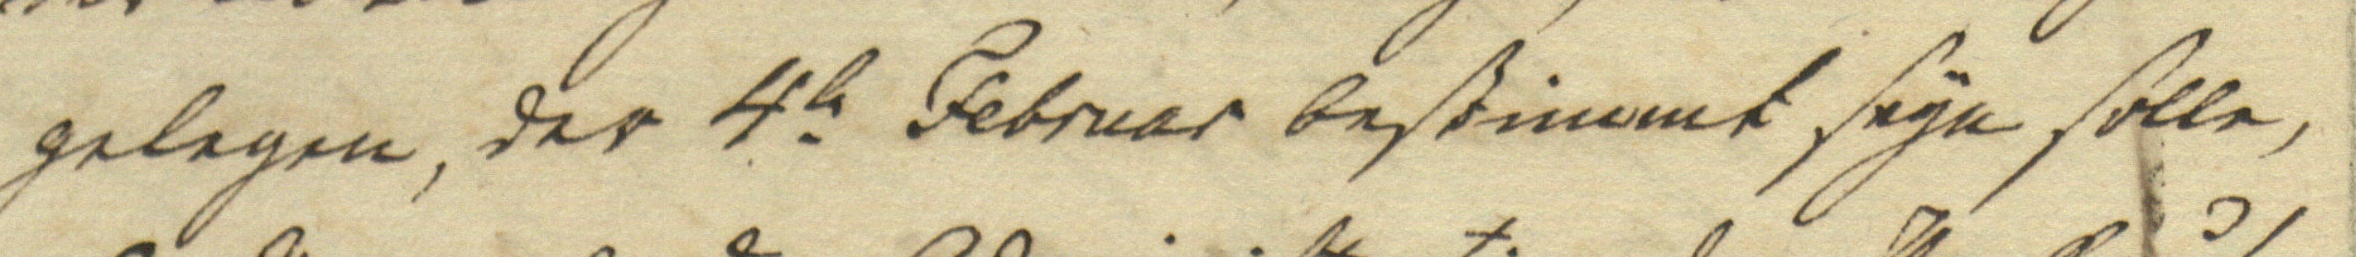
gelegen, der 4 t. Februar bestimmt seÿn solle,
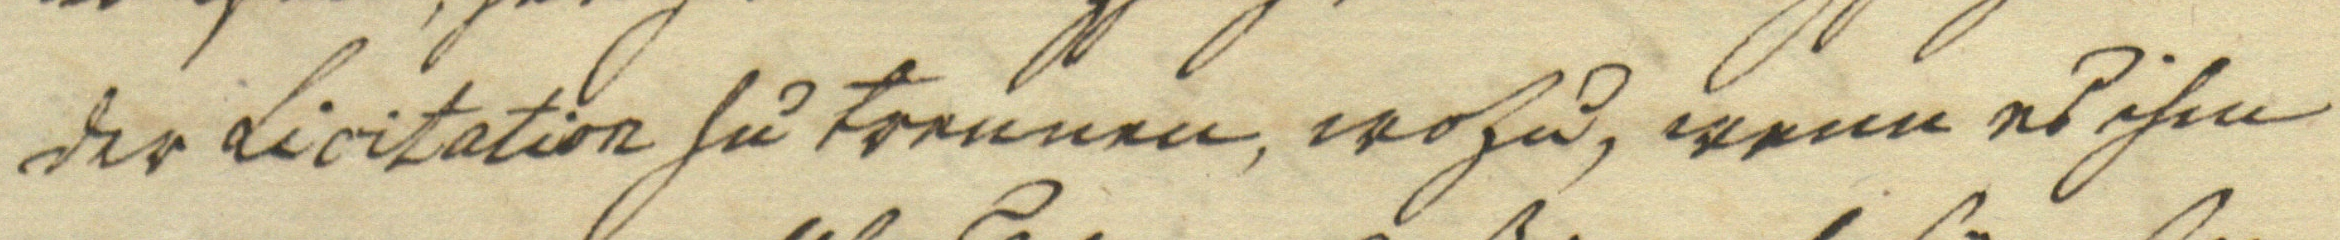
der Licitation zu trennen, wozu, wenn es ihm
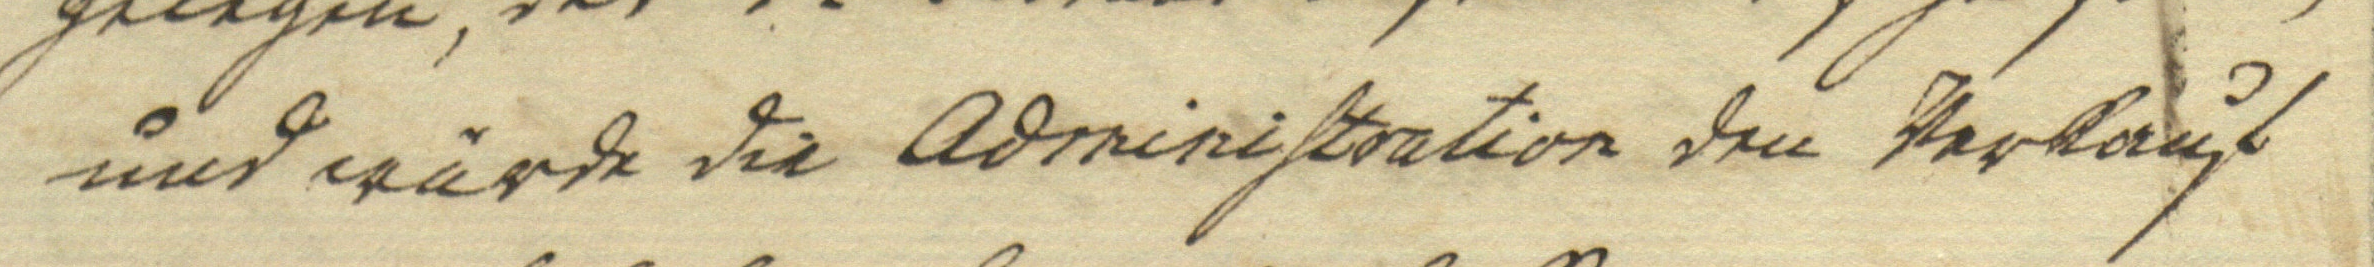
und würde die Administration den Verkauf
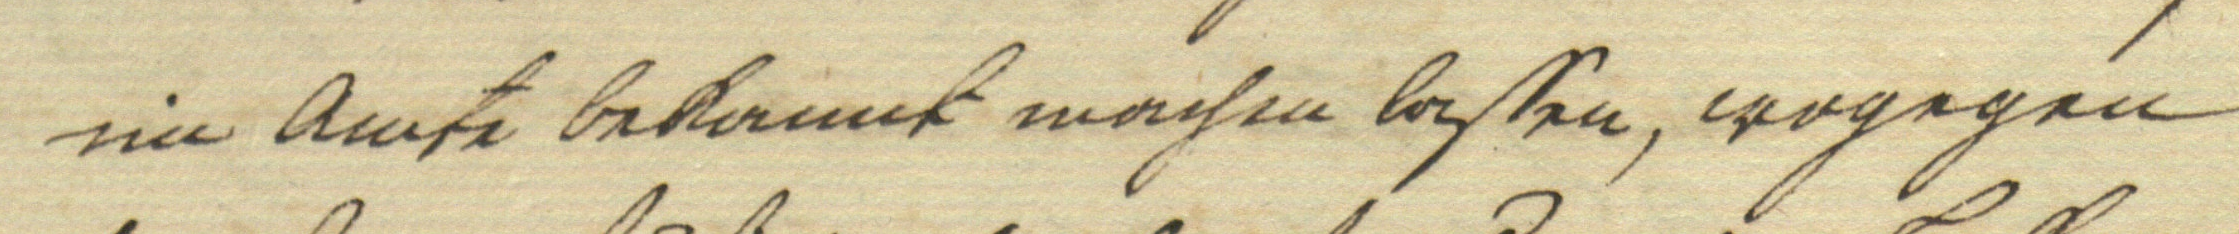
in Amte bekannt machen lassen, wogegen
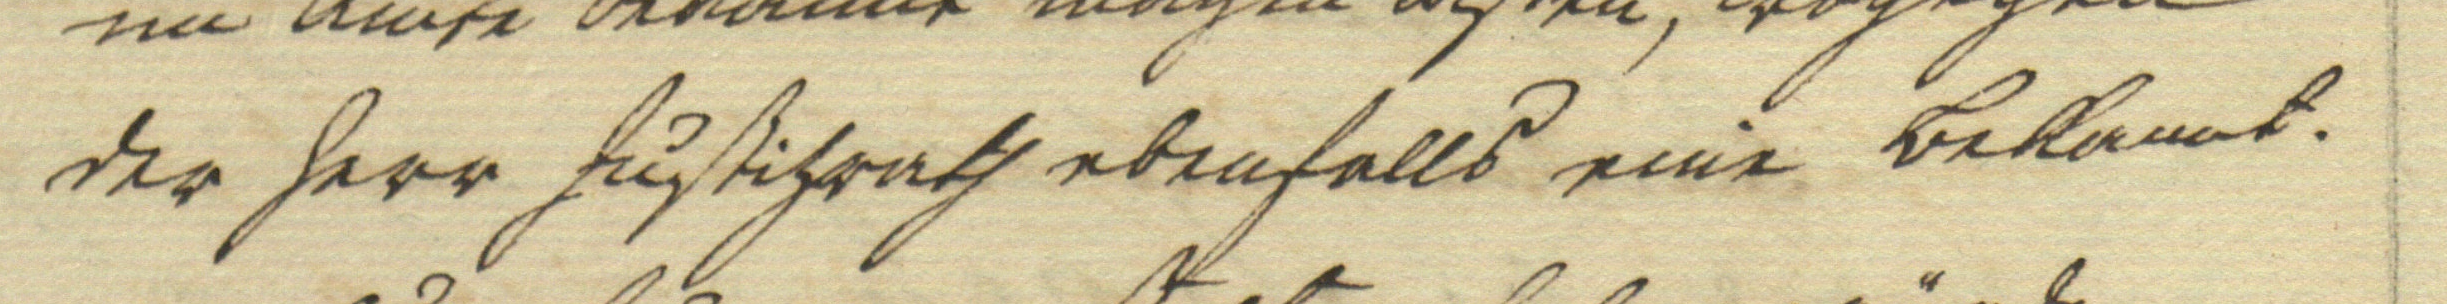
der Herr Justizrath ebenfalls eine Bekannt¬
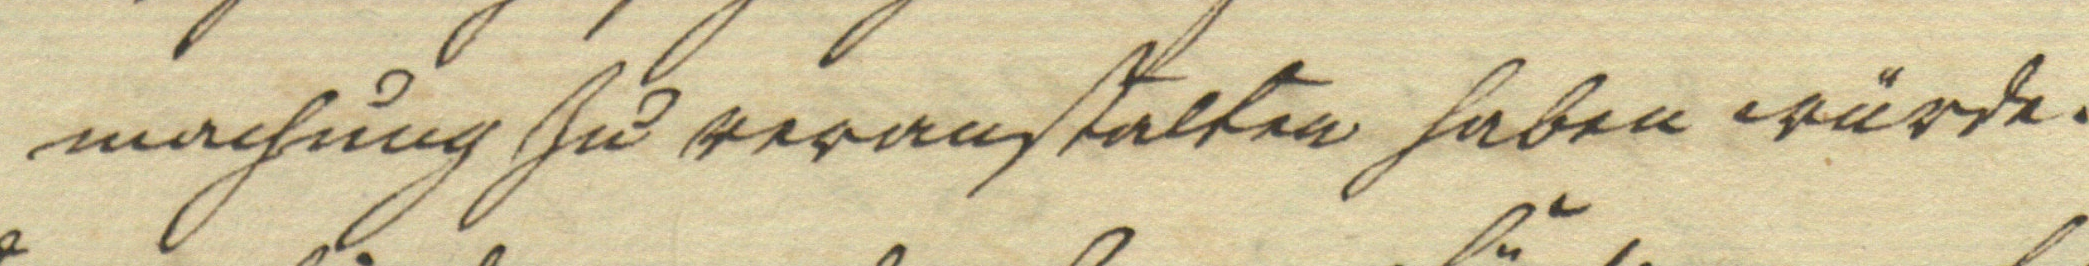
machung zu veranstalten haben würde.
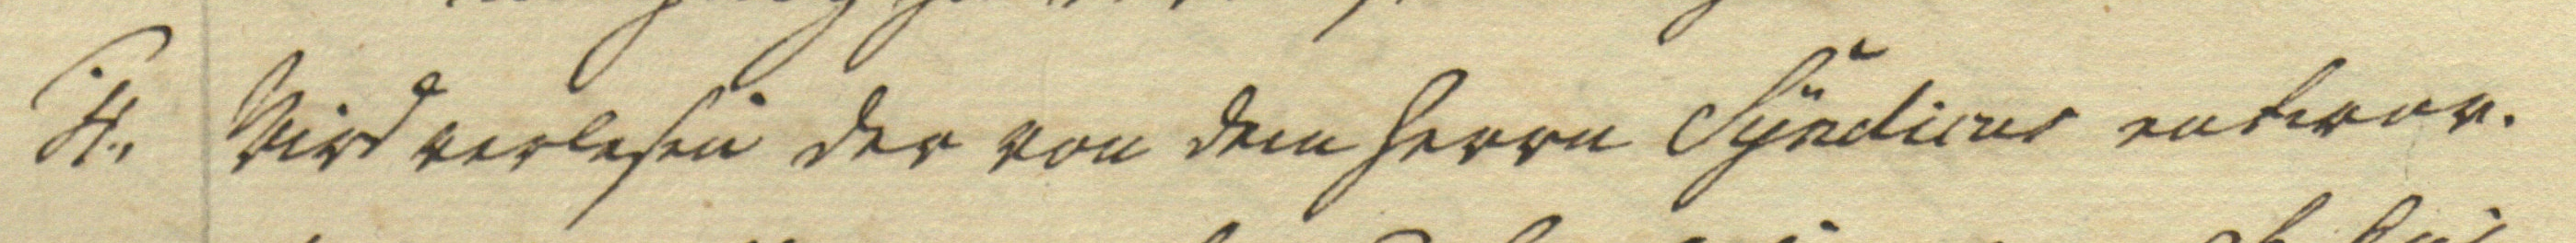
4. Wird verlesen der von dem Herrn Sÿndicus entwor¬
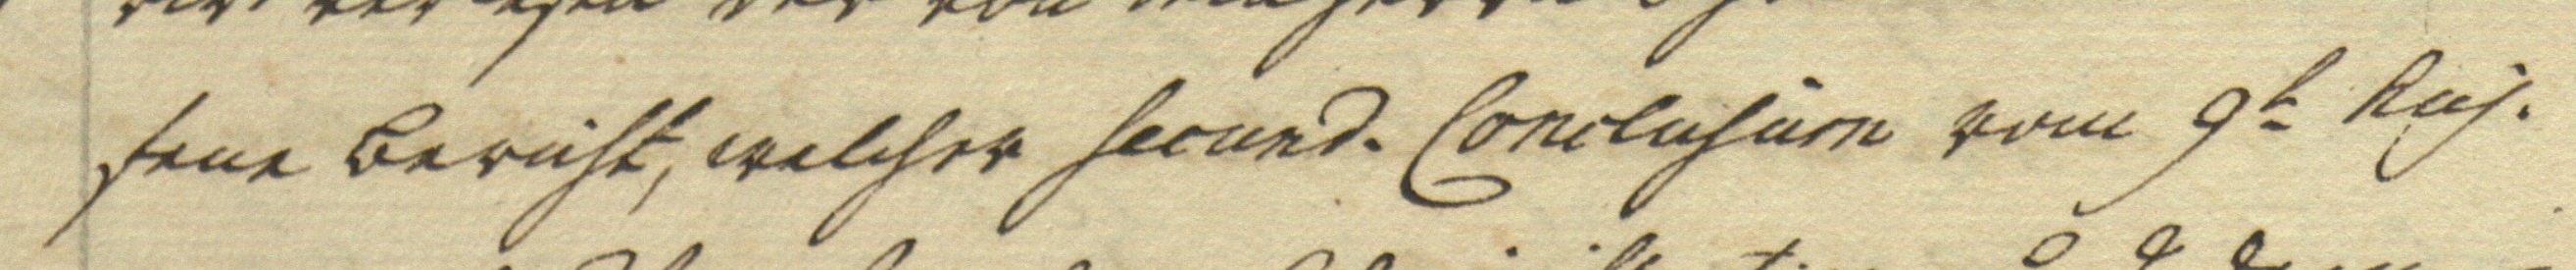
fene Bericht, welcher secund. Conclusum vom 9 te huj.
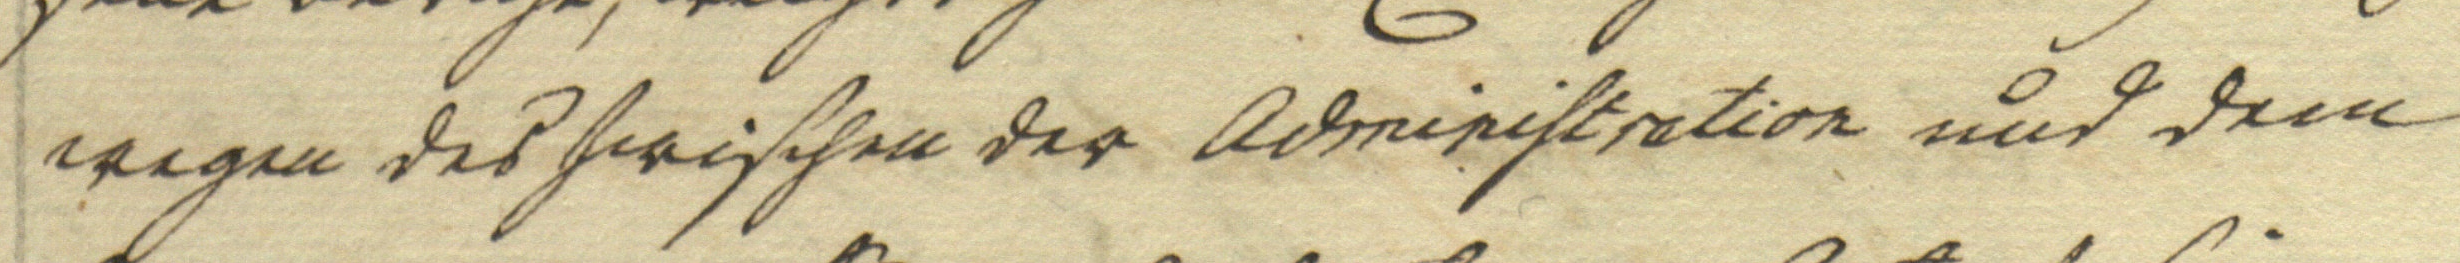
wegen des zwischen der Administration und dem
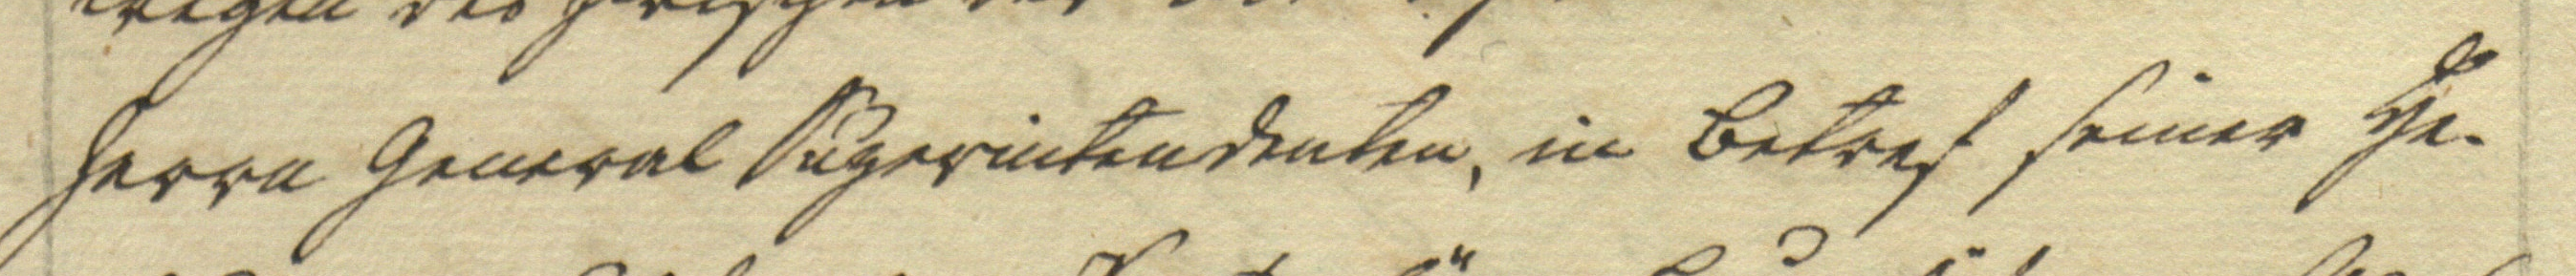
Herrn General Superintendenten, in Betref seiner He¬
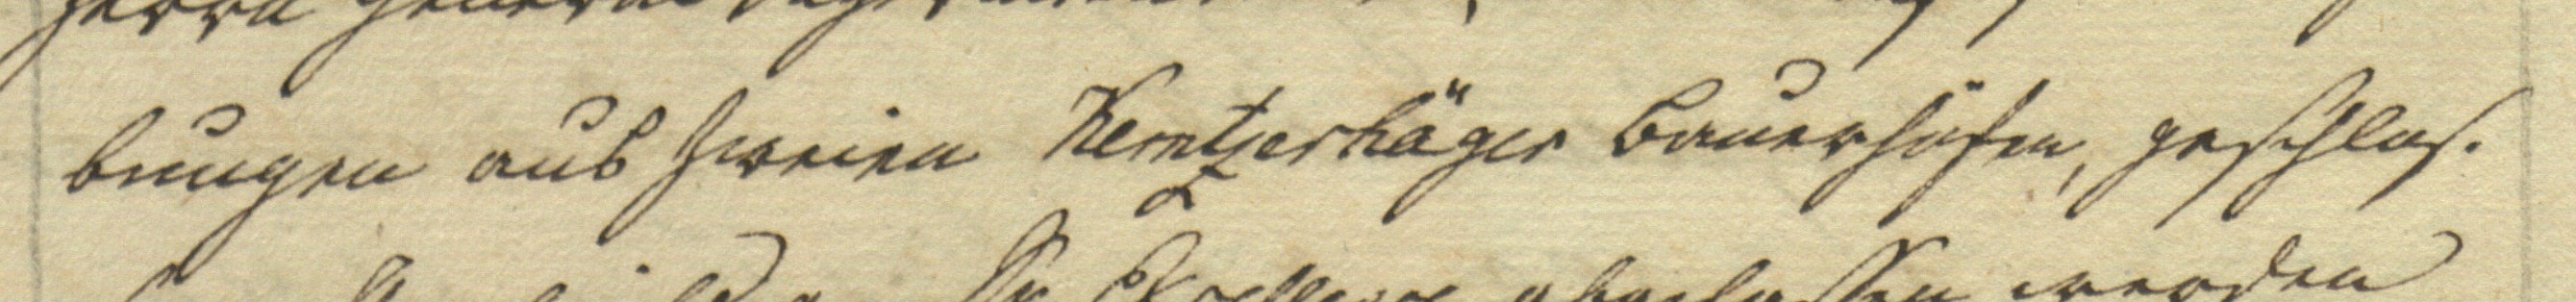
bungen aus zweien Kemtzerhäger Bauerhöfen, geschlos¬
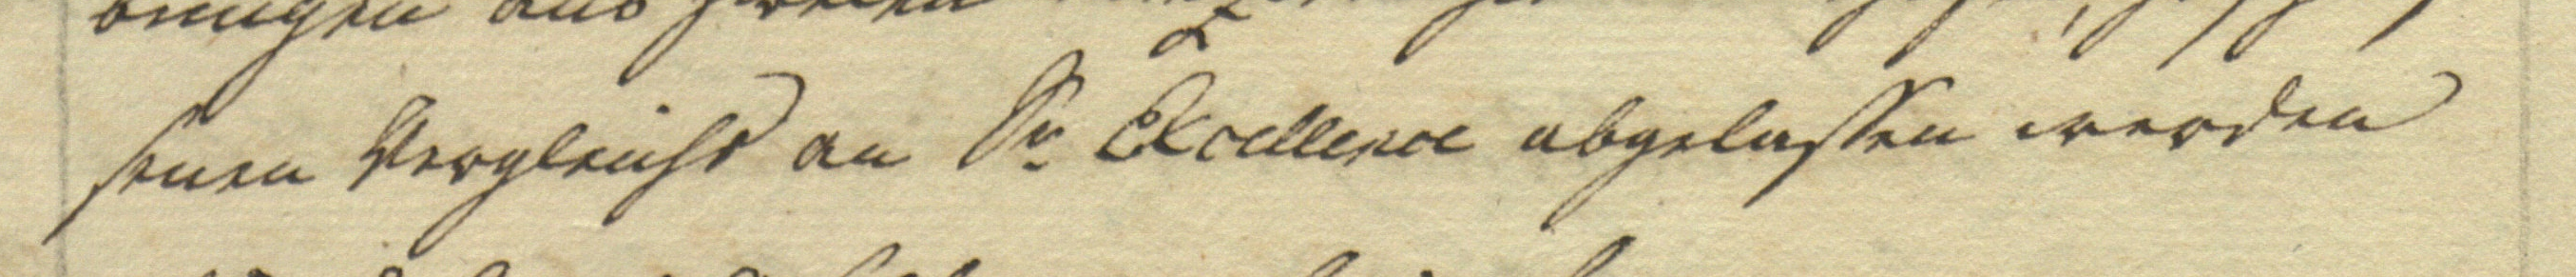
senen Vergleichs an Sr Excellence abgelassen werden
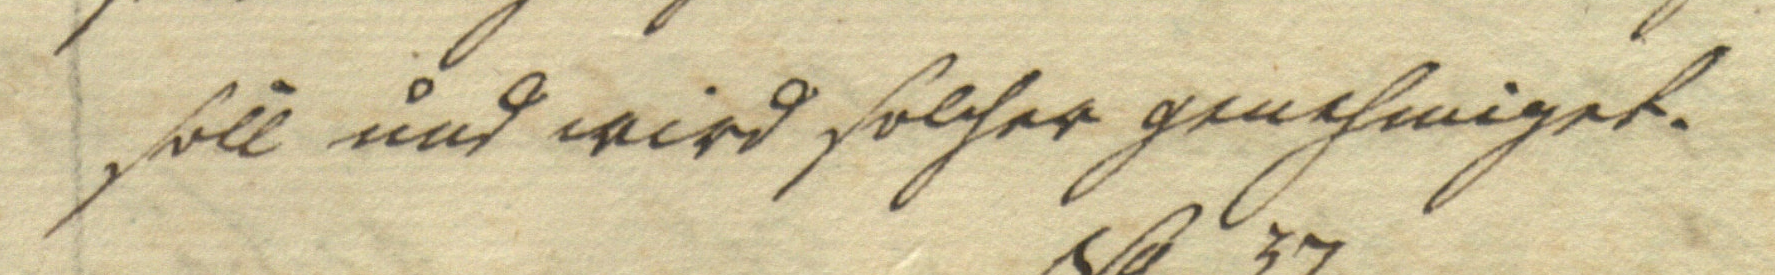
soll und wird solcher genehmiget.
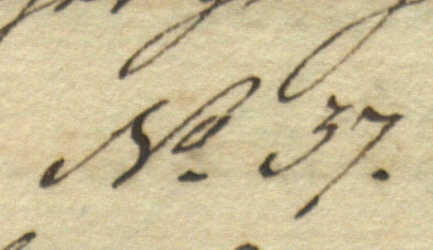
No 37.
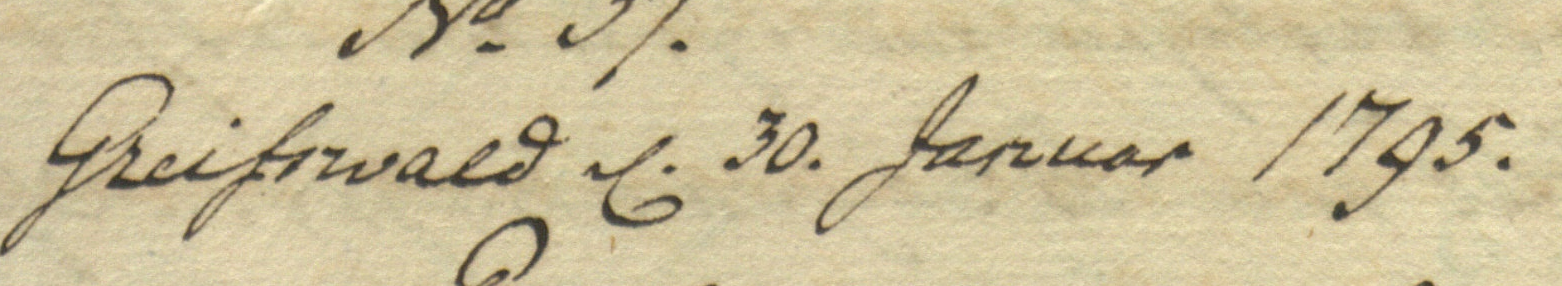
Greifswald d. 30. Januar 1795.
